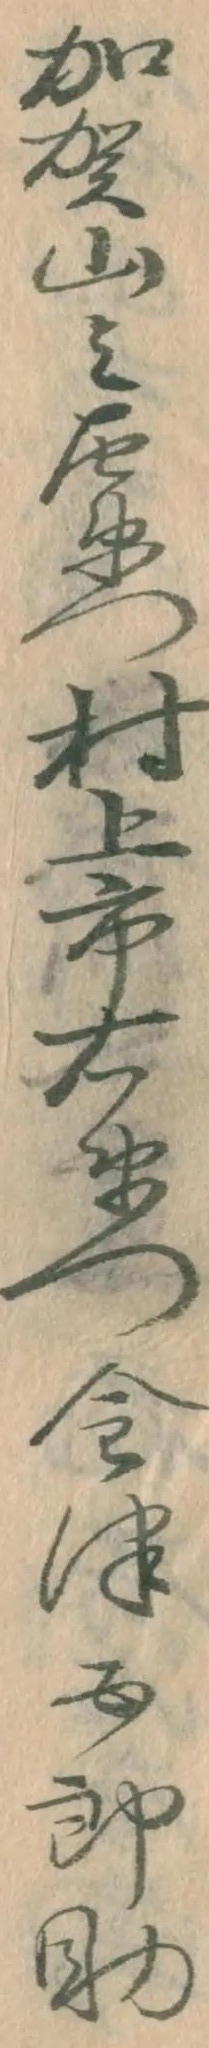加賀山与左衛門村上市右衛門金津五郎助

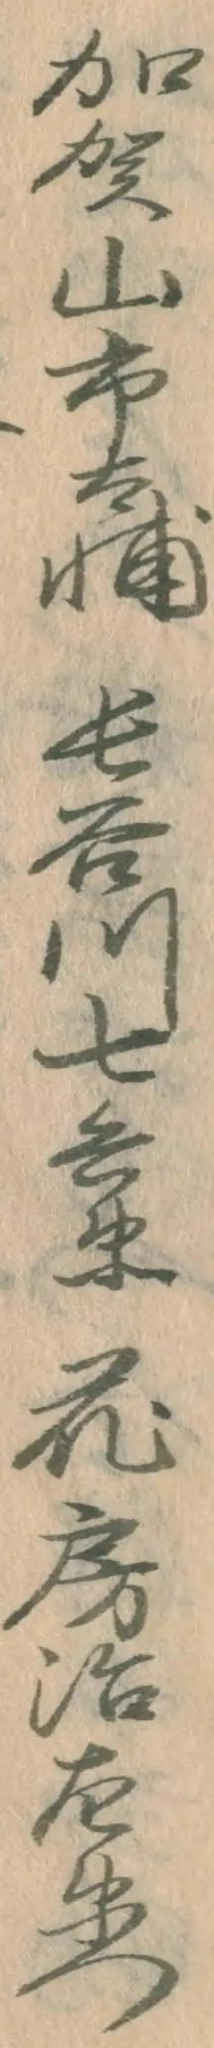加賀山市太輔長谷川七兵衛花房治左衛門
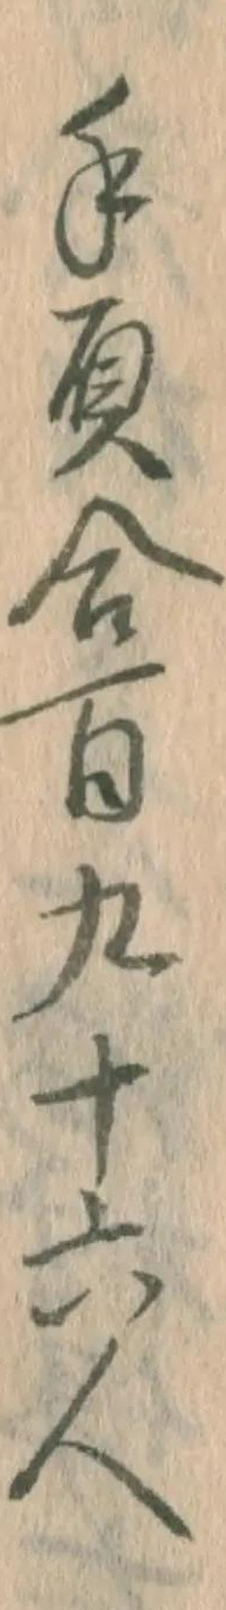手負合百九十六人
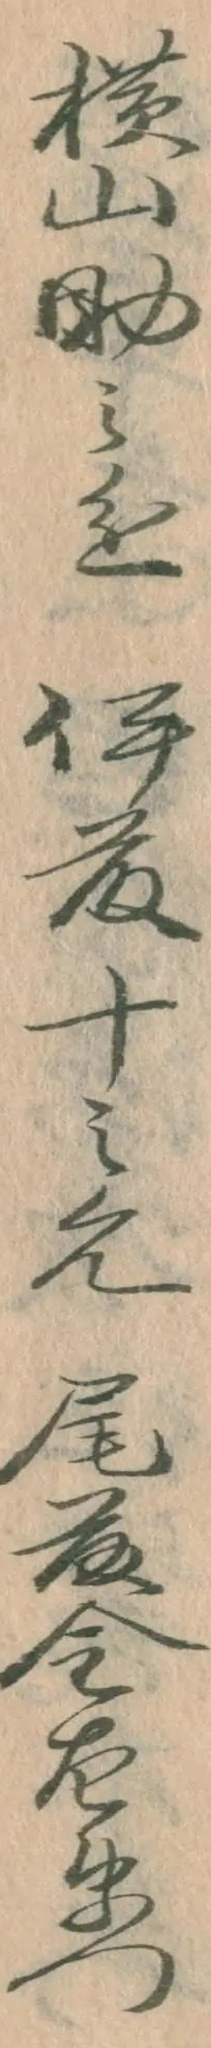横山助之進伊藤十之允尾藤金左衛門
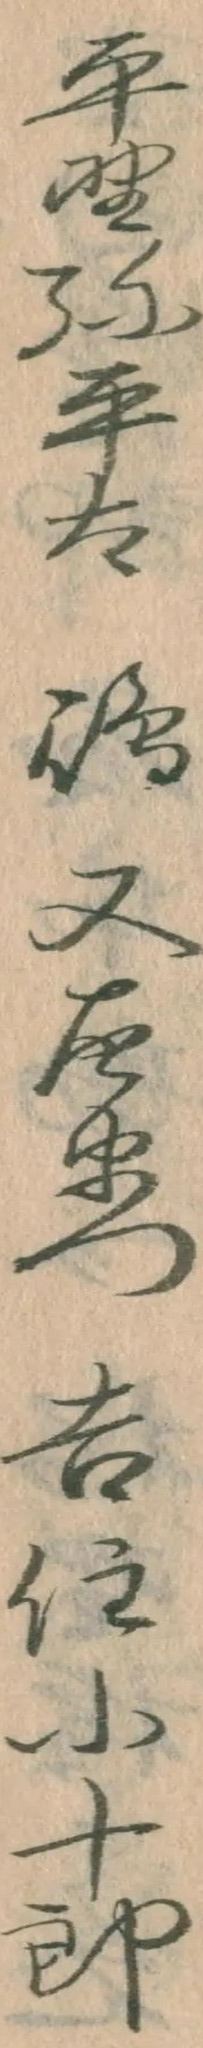平野弥平太島又左衛門吉住小十郎
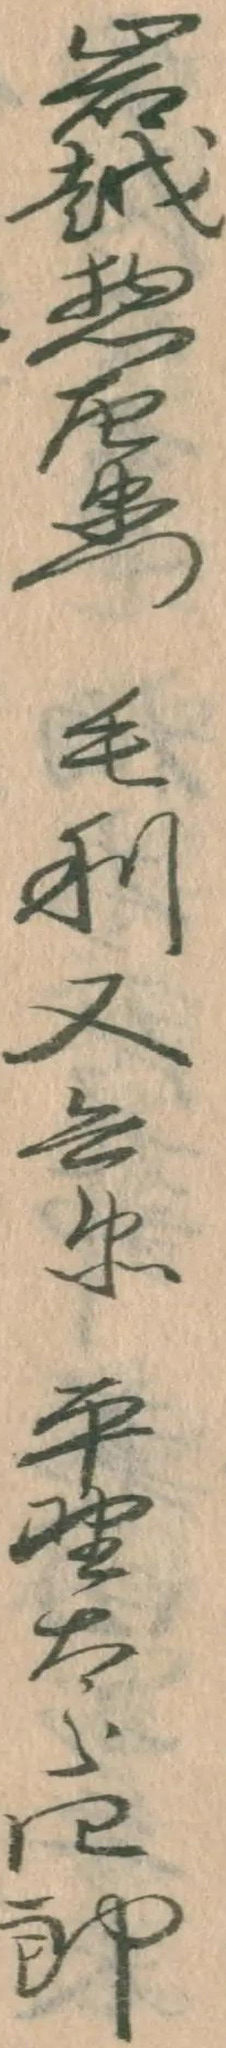岩越惣左衛門毛利又兵衛平野太郎四郎
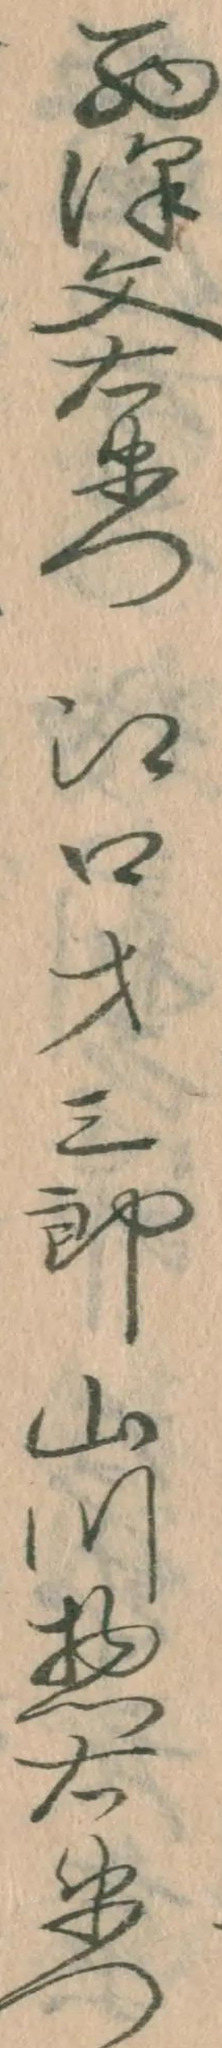西沢文右衛門江口才三郎山川惣右衛門
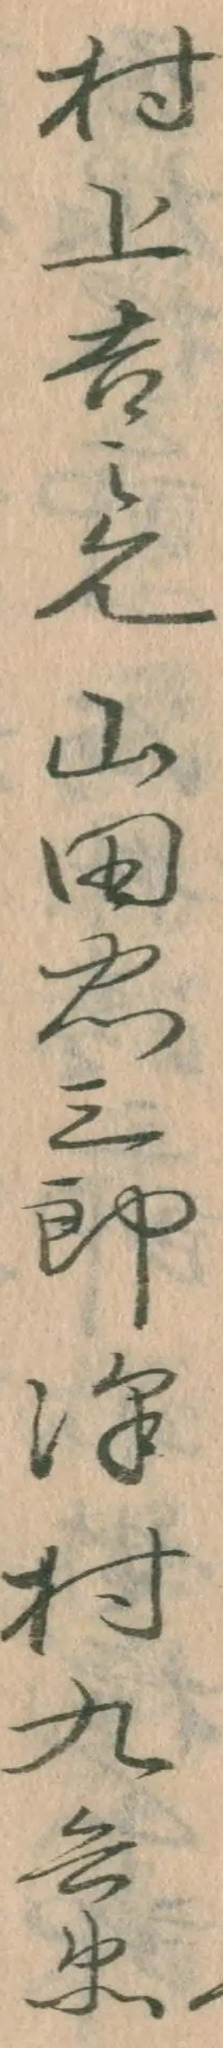村上吉之允山田忠三郎沢村九兵衛
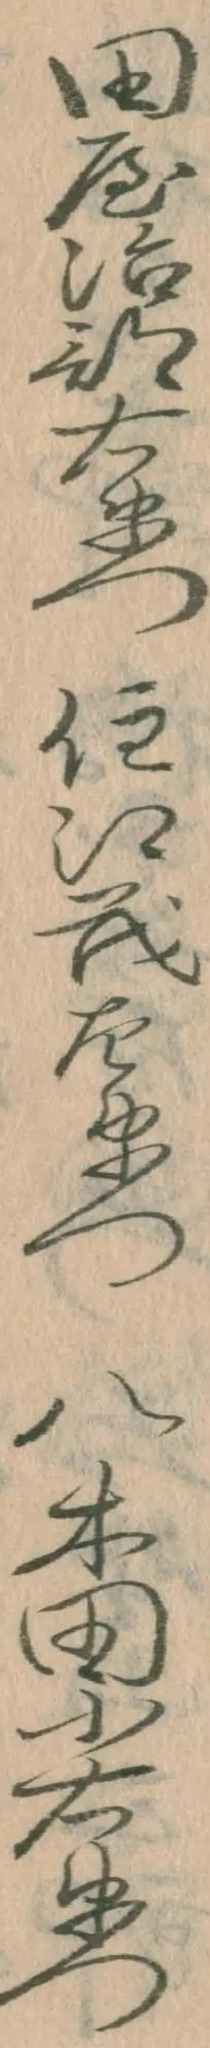田屋治部右衛門住江茂左衛門八木田小右衛門
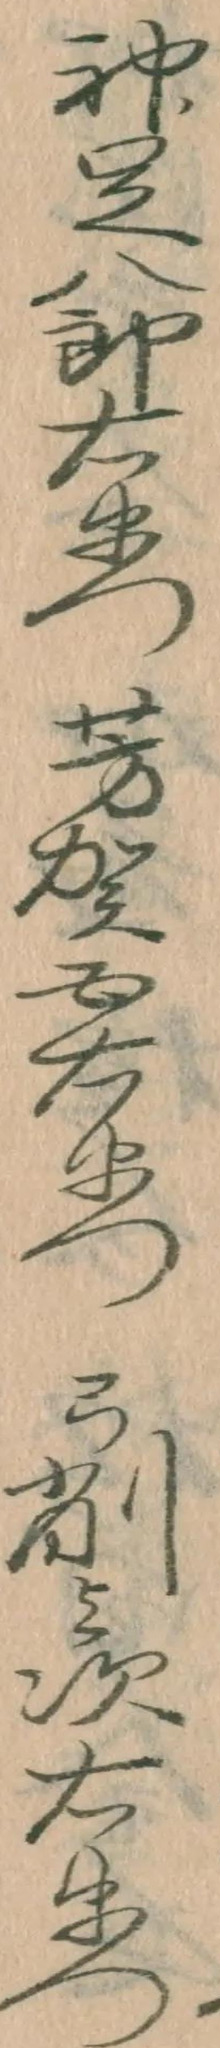神足八郎右衛門芳賀五右衛門弓削与次右衛門
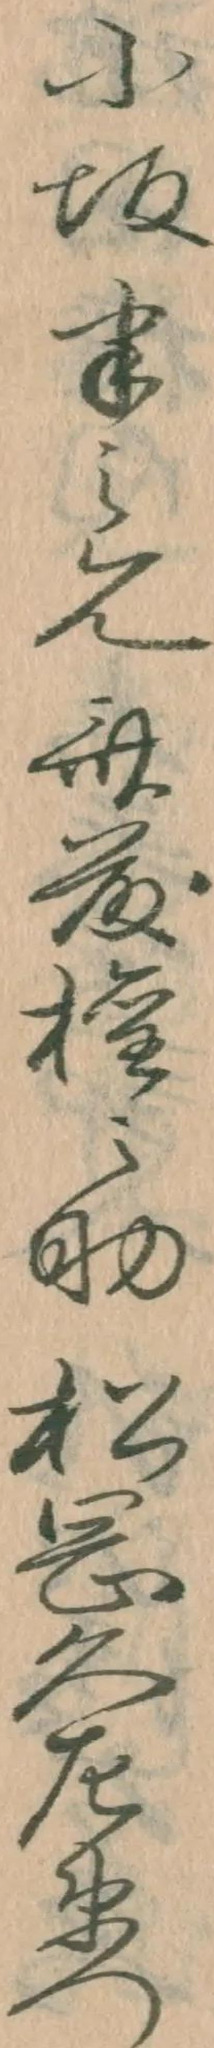小坂半之允斎藤権之助松岡九左衛門
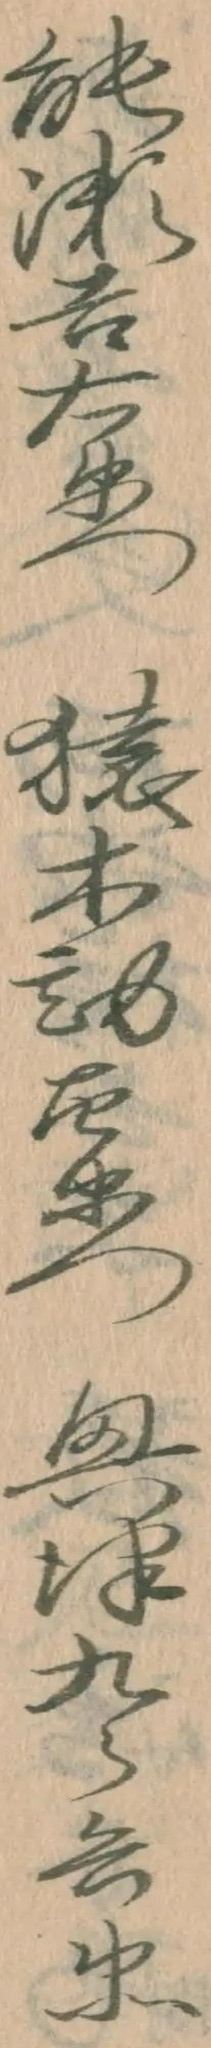能瀬吉右衛門猿木勘左衛門奥津九郎兵衛
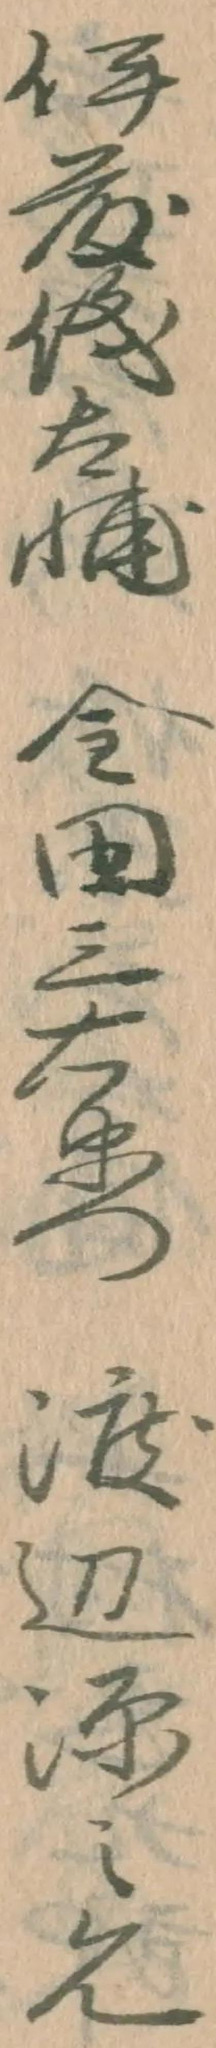伊藤儀太輔金田三右衛門渡辺源之允
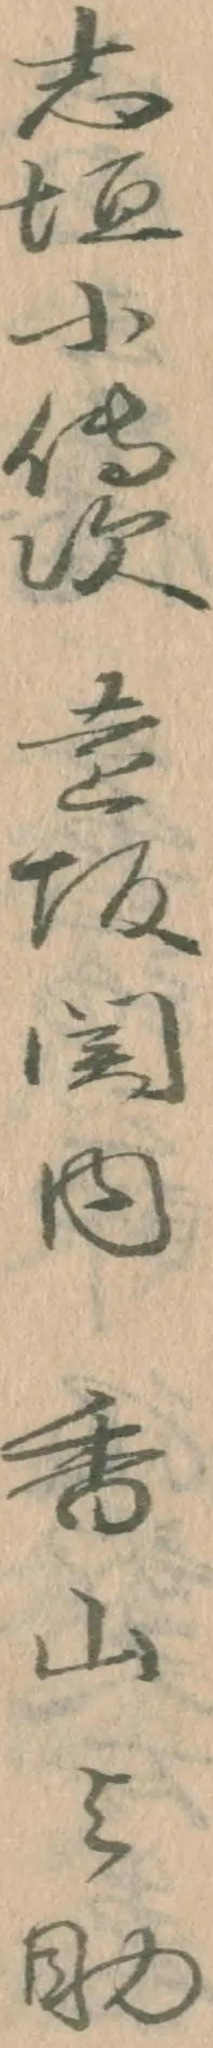志垣小伝次遠坂関内香山与助
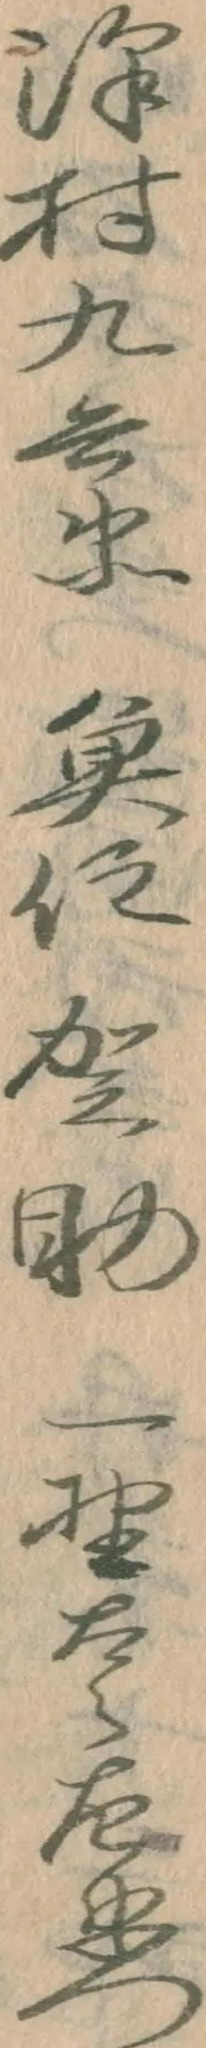沢村九兵衛魚住賀助野太郎左衛門
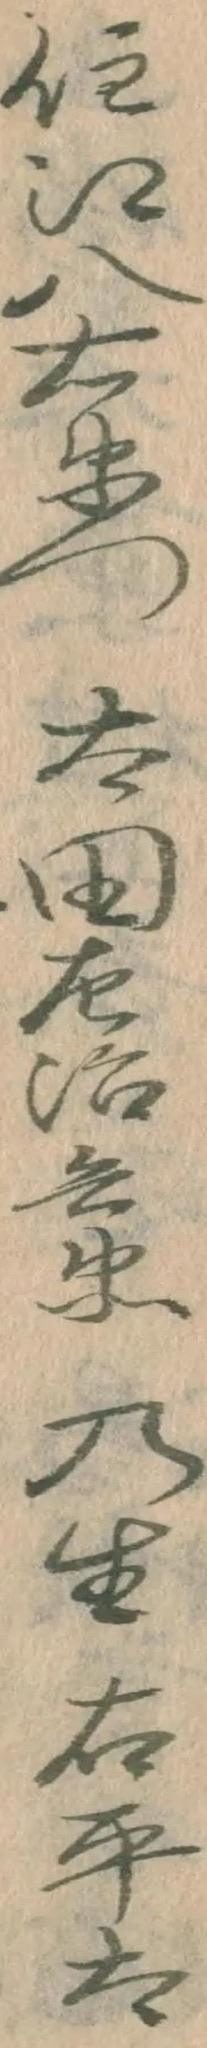住江八右衛門太田佐治兵衛乃生右平太
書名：切支丹御退治記 49巻. [9]
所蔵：国立国会図書館 National Diet Library, JAPAN
